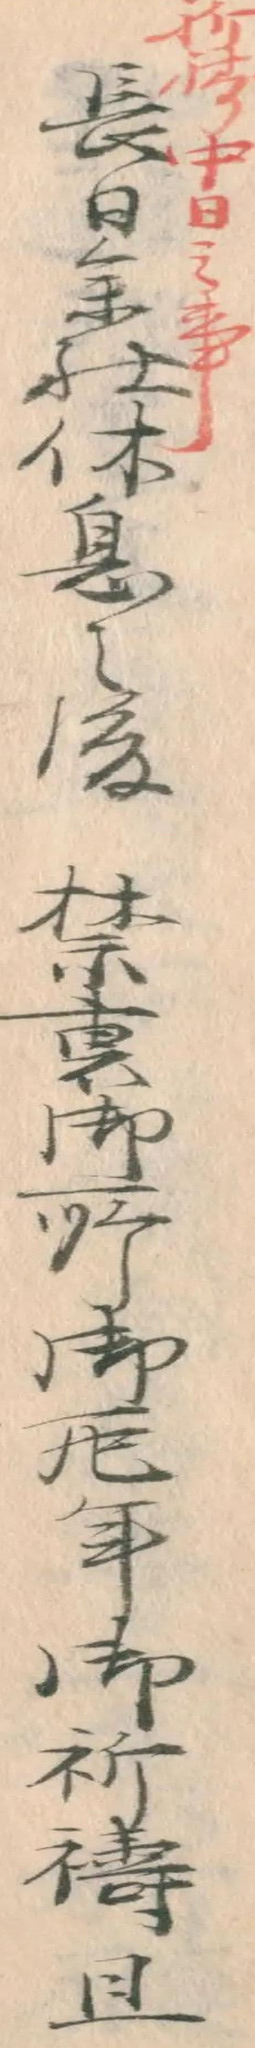一長日参社休息之後禁裏御所御厄年御祈祷且
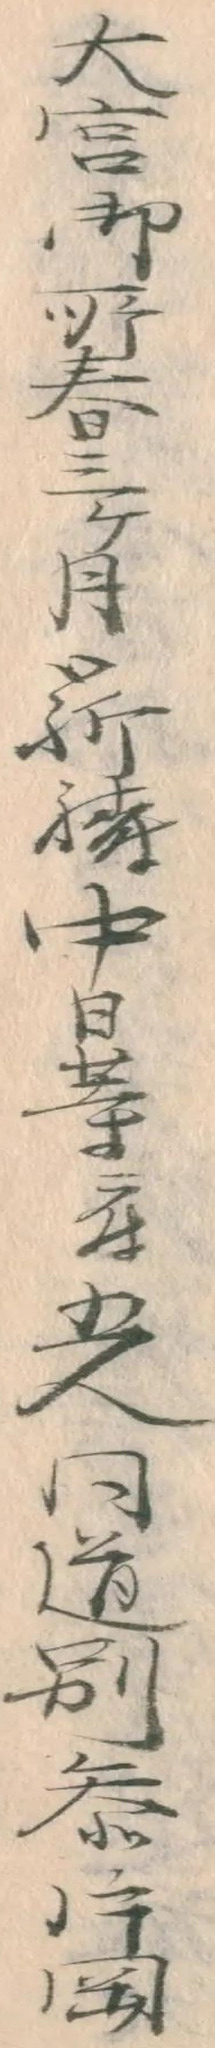大宮御所春三ヶ月御祈祷中日等ニ付五人同道別参片岡
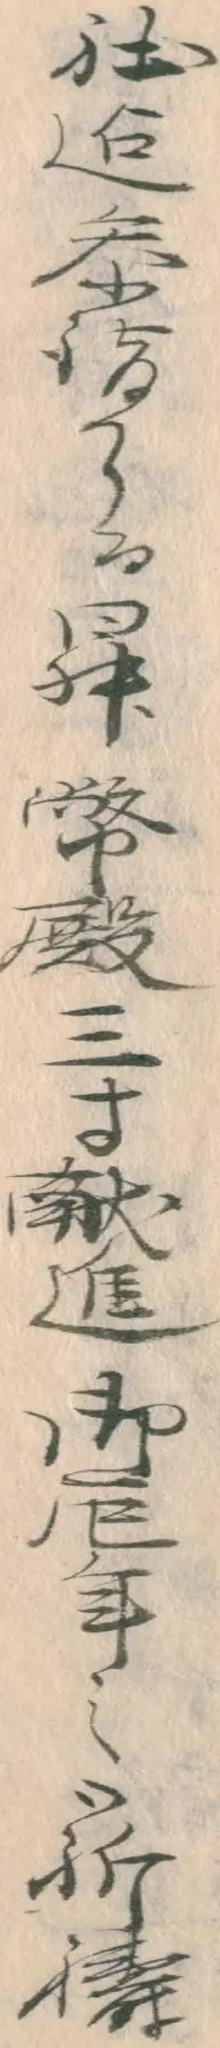社迄参詣終了而日拝幣殿三寸献進御厄年之御祈祷
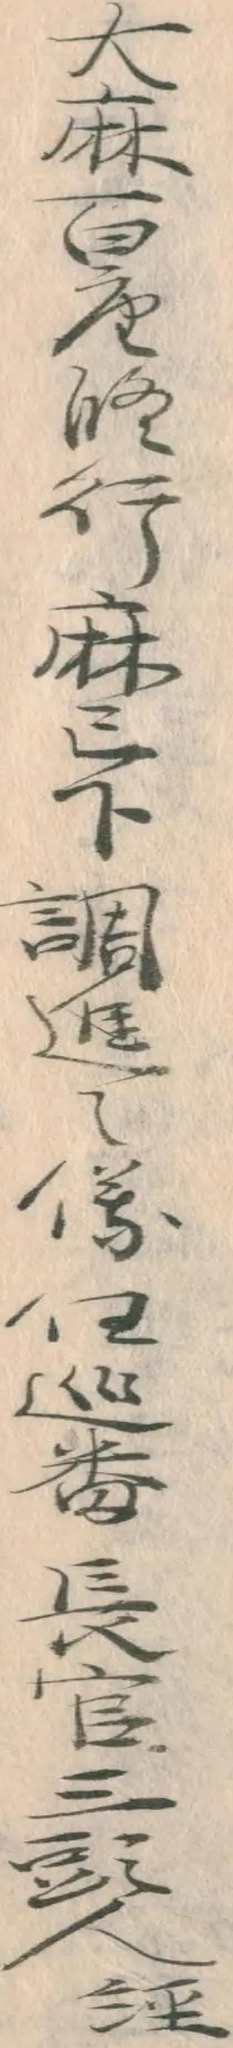大麻百座修行麻已下調進之儀任巡番長官三頭人経
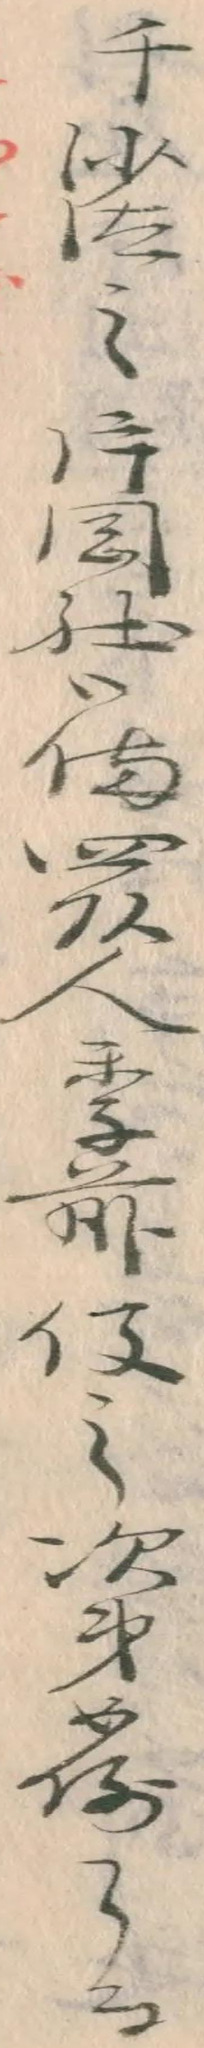千沙汰之片岡社御備四頭人季前役之次第如例了而
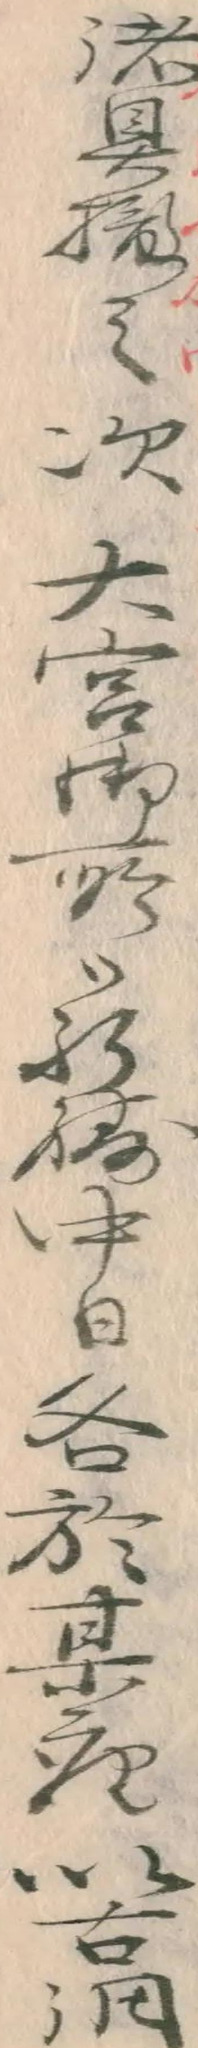諸具撤也次大宮御所御祈祷中日各於某座以古調
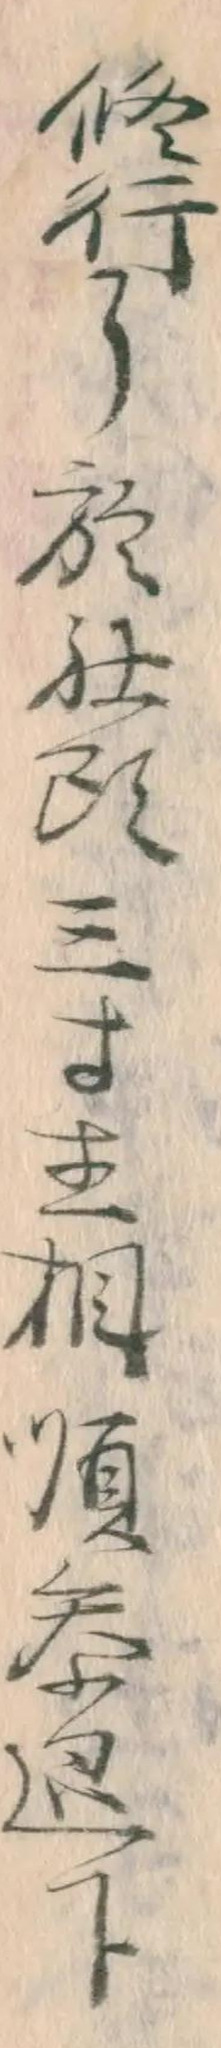修行了於社頭三寸直相順参退下
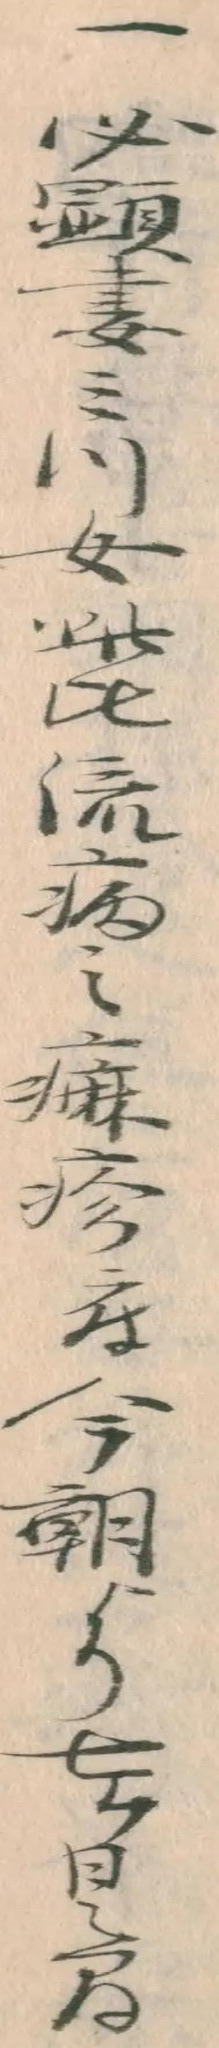一必顕妻ミつ女此頃流病之麻疹ニ付今朝より七ケ日之間
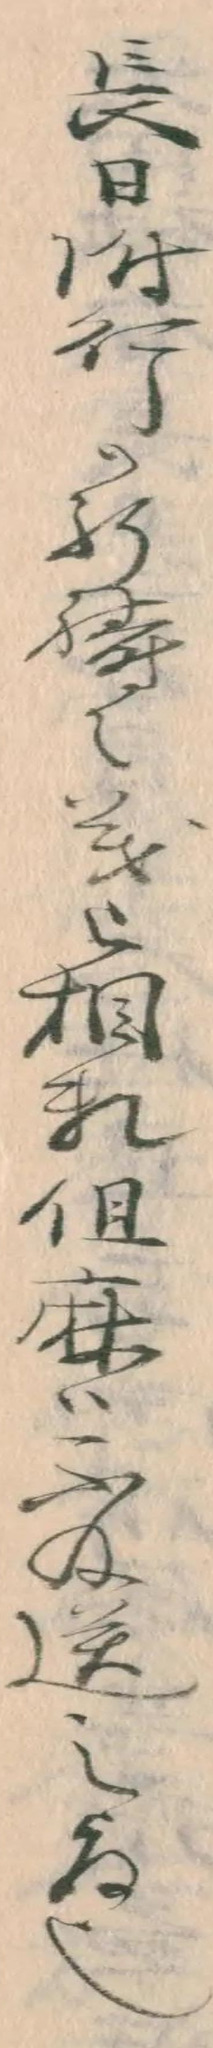長日附行御祈祷之義被相頼但麻ハ不及送之旨也
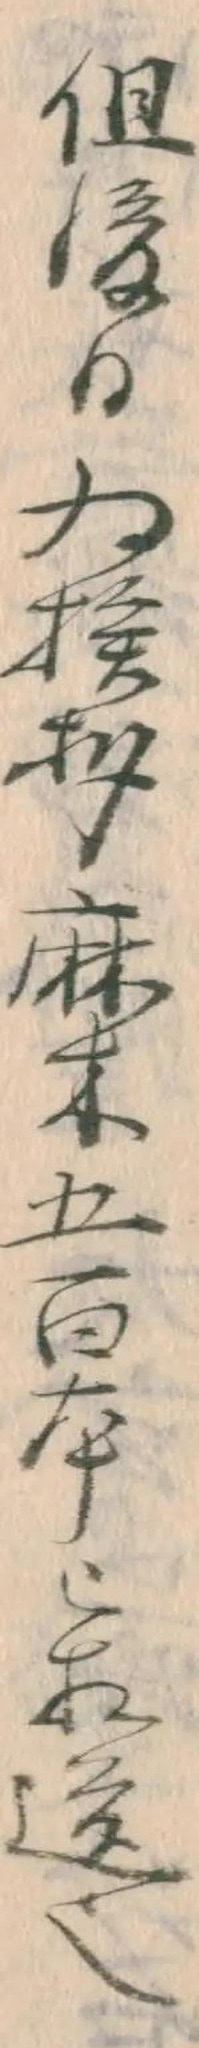但後日為挨拶麻木五百本被相送也
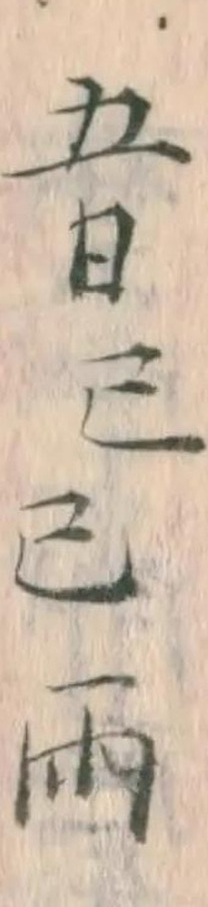五日己巳雨
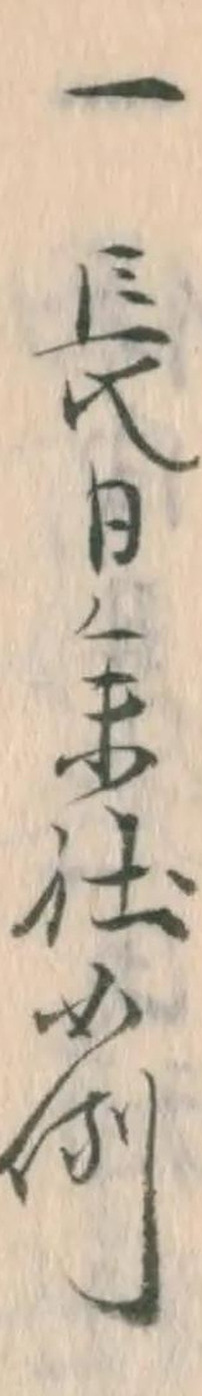一長日参社如例
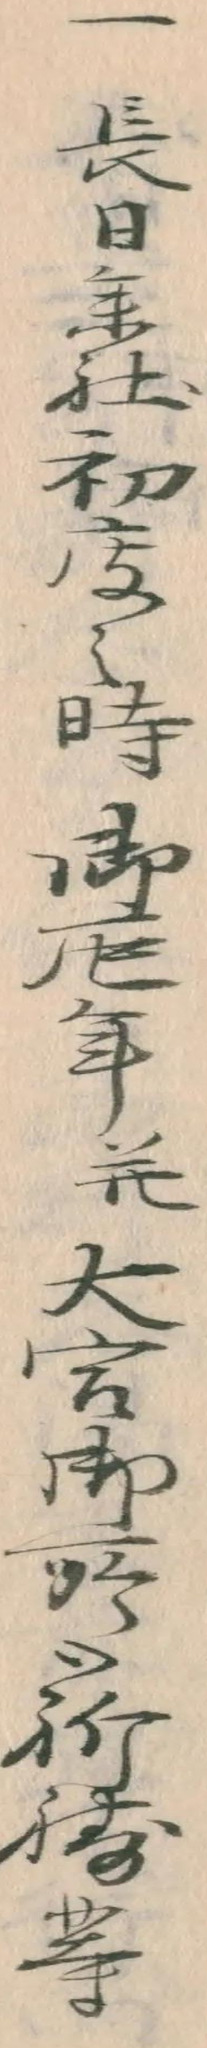一長日参社初度之時御厄年并大宮御所御祈祷等
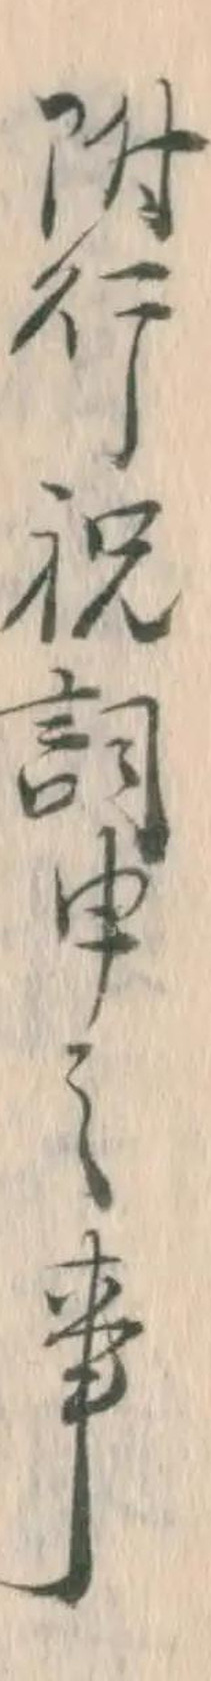附行祝詞申之事
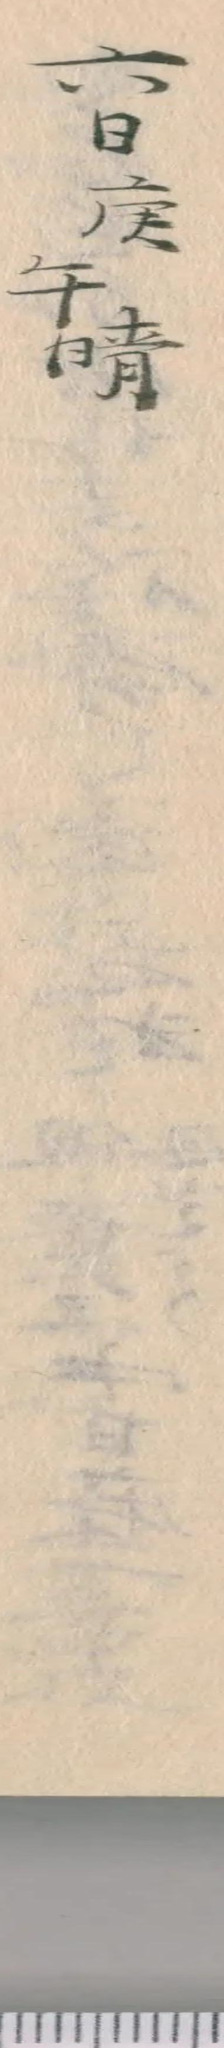六日庚午晴
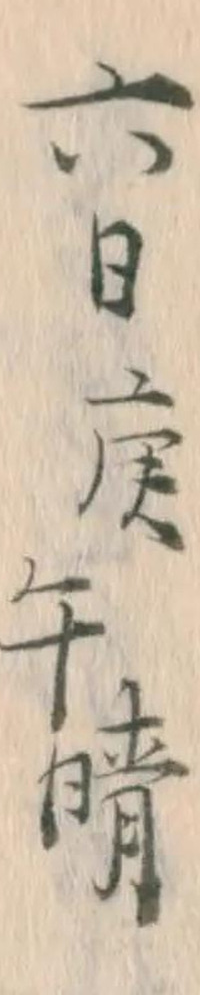六日庚午晴
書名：賀茂社記録. 第73冊
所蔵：国立国会図書館 National Diet Library, JAPAN
